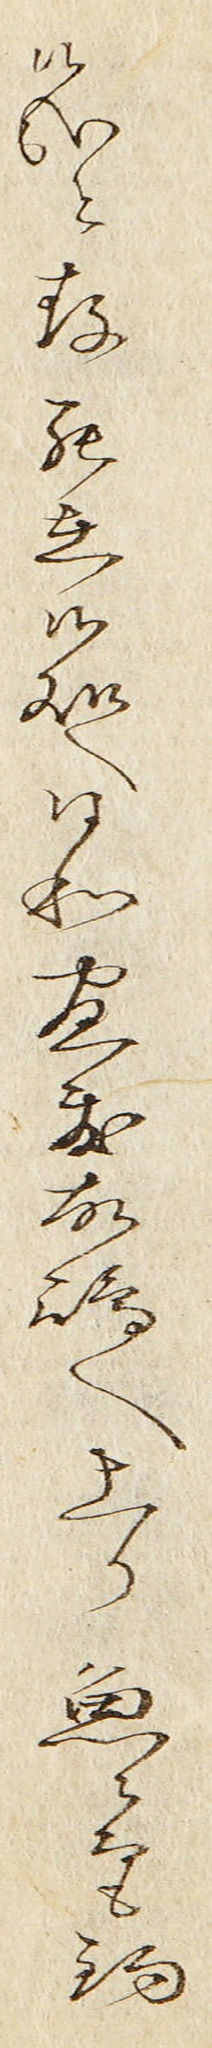候哉と存罷在候処へ日和宜敷故嶋へ上り魚に而も釣
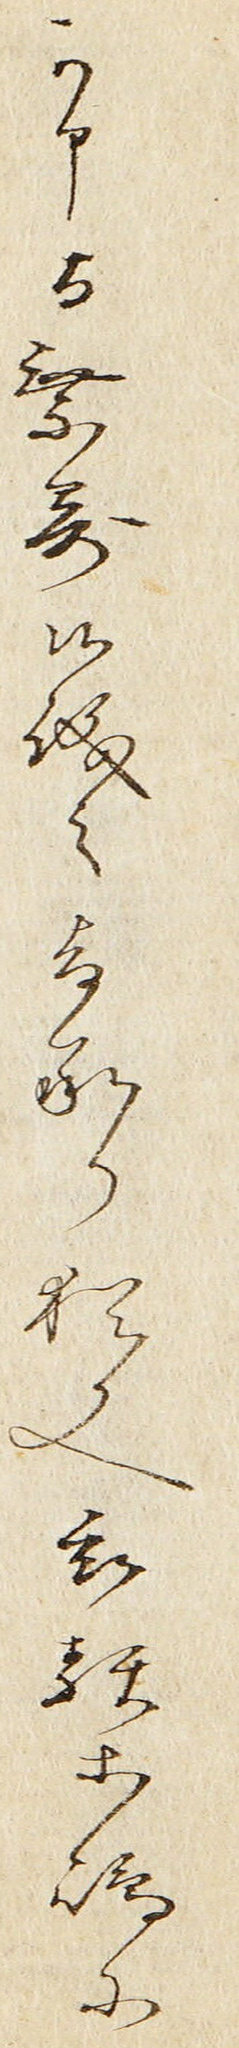可申与乗寄候儀之旨承り猶又衣類等嶋に
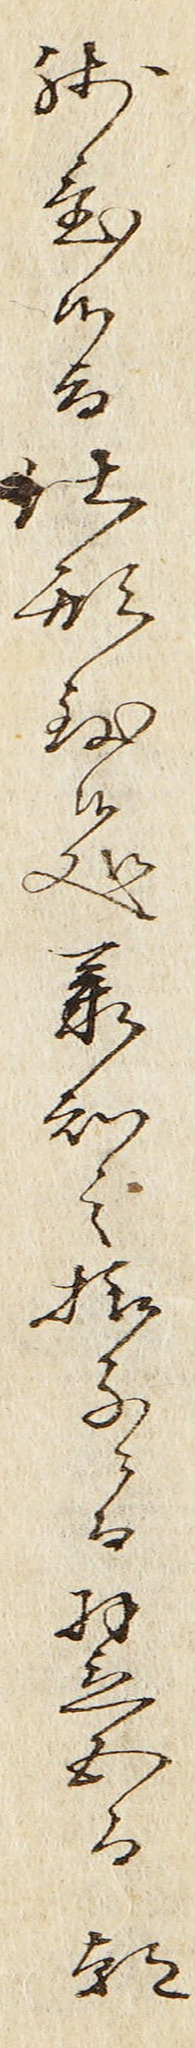残置候旨仕形致候処承知之様子に而翌五日朝
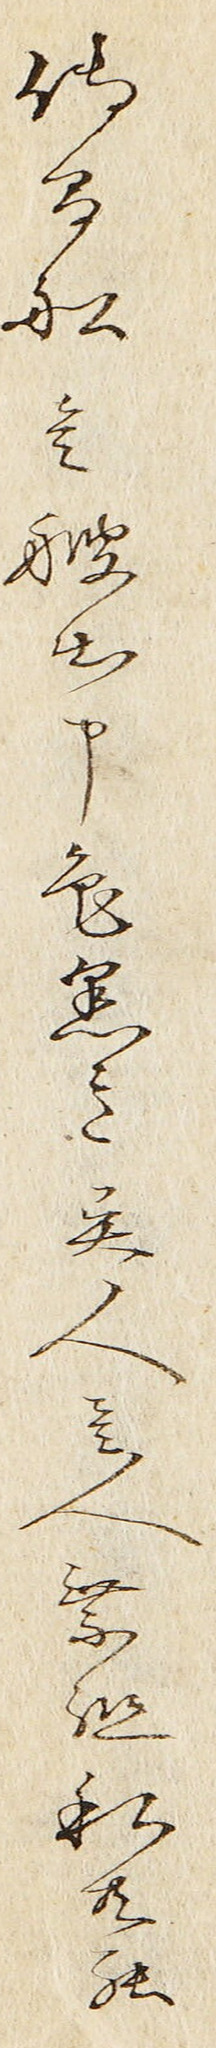伝間船壱艘出申色黒き異人壱人乗組私共罷
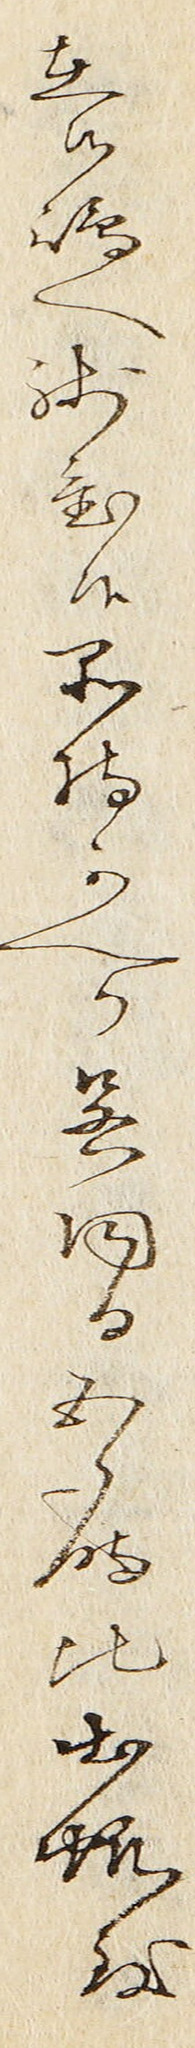在候嶋へ残置候品持かへり同日五ッ時比出帆致
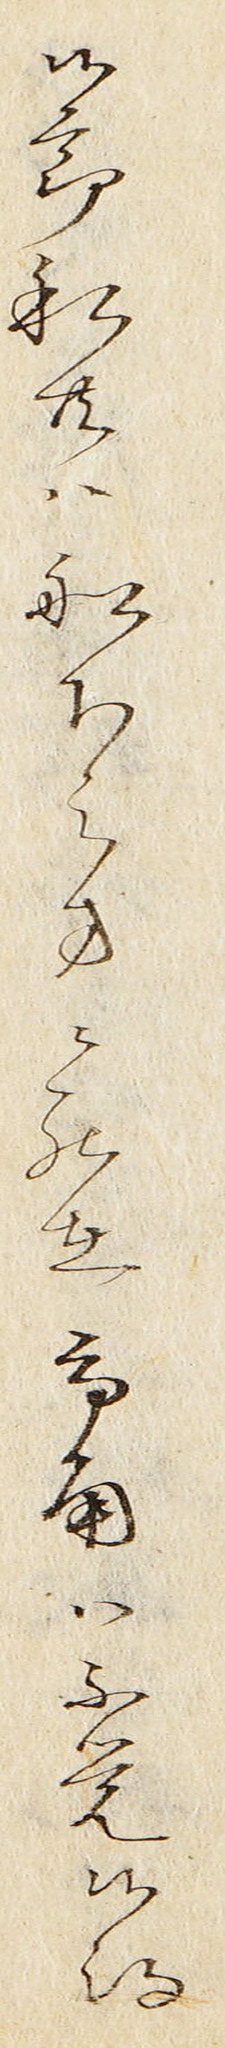候節私共は船下之方に罷在方角は不覚候得
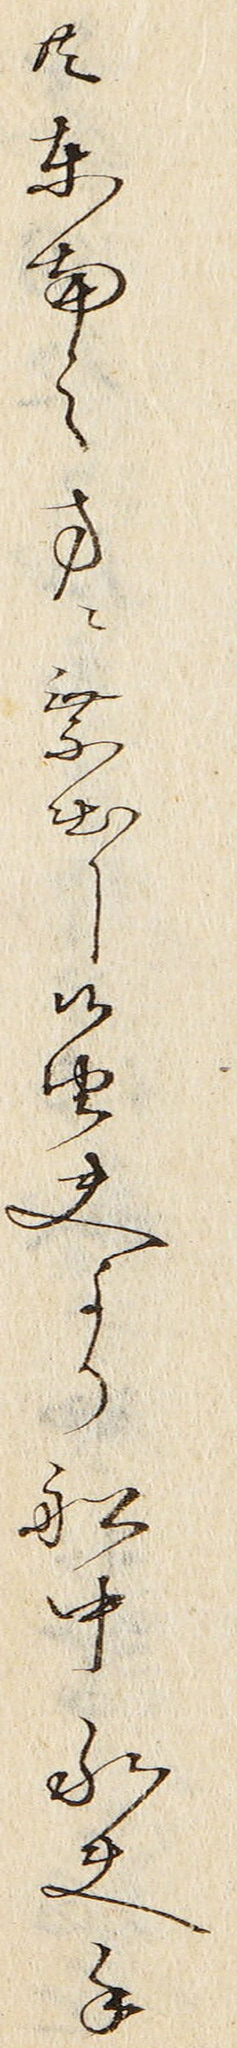共東南之方に乗出し候由夫より船中水夫手
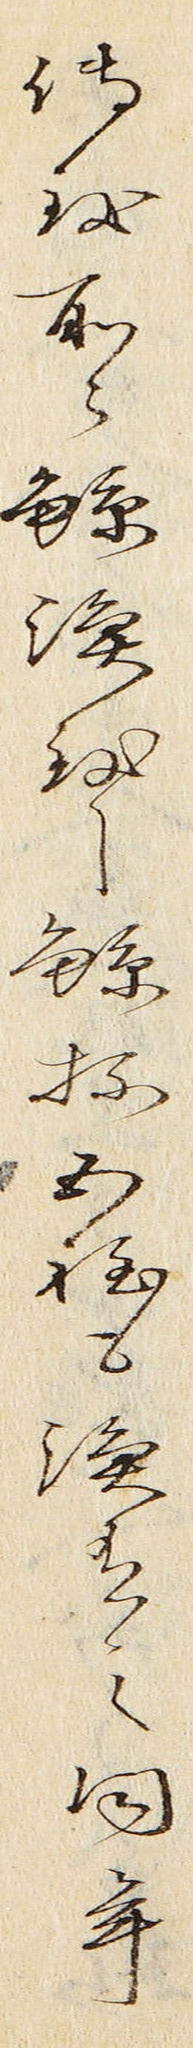伝致所々鯨漁致し鯨抔五程も漁有之同年
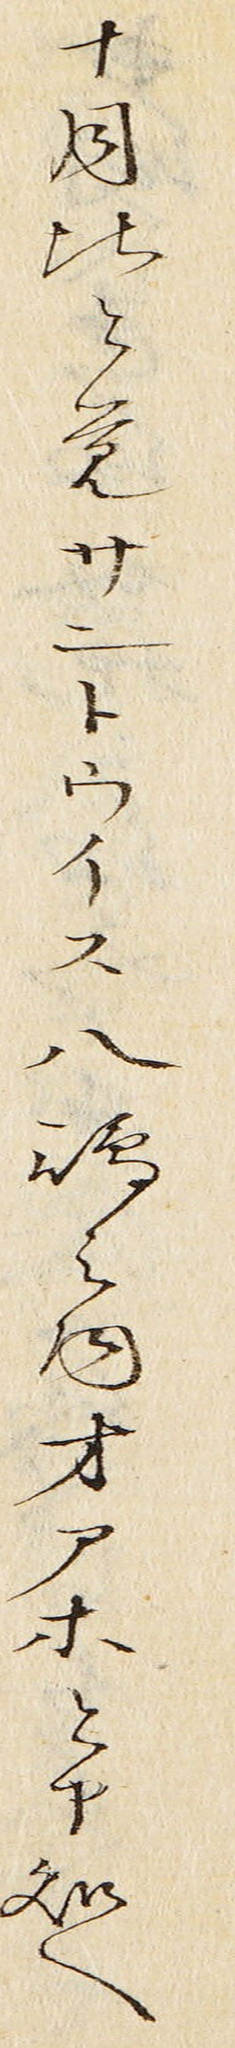十月比と覚サントウイス八嶋之内オアホと申処へ
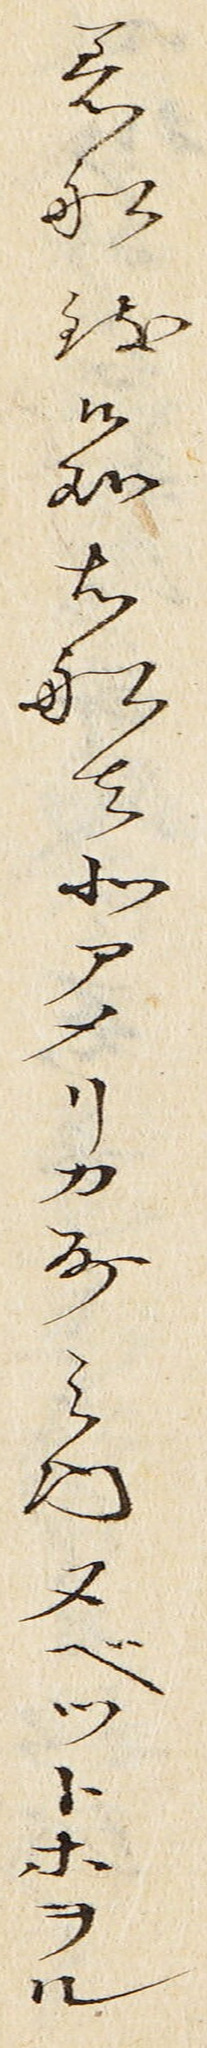着船致候処右船は北アメリカ州之内ヌベツトホヲル
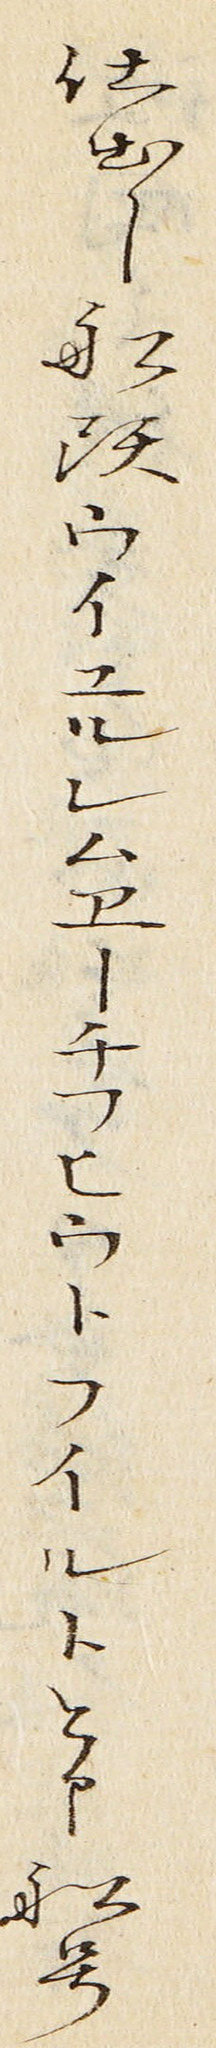仕出し船頭ウイユルレムエーチフヒフトフイルトと申す船号
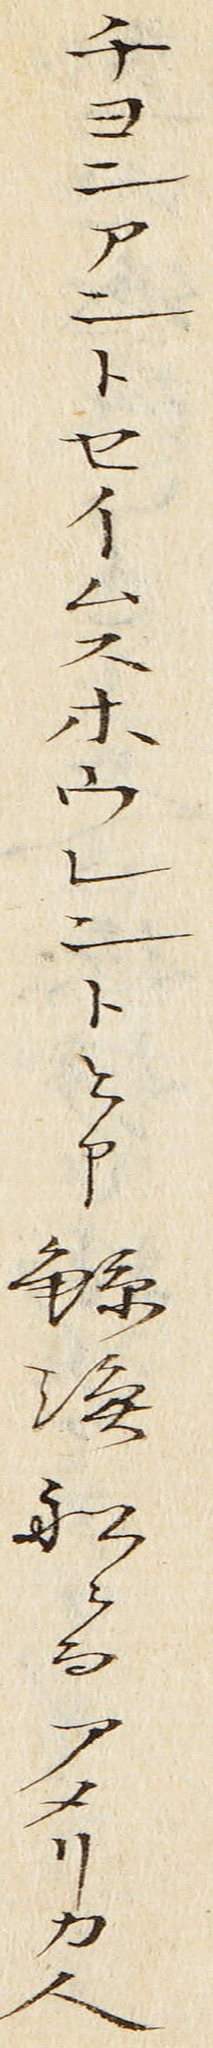チヨンアントセイムスホウレントと申鯨漁船に而アメリカ人
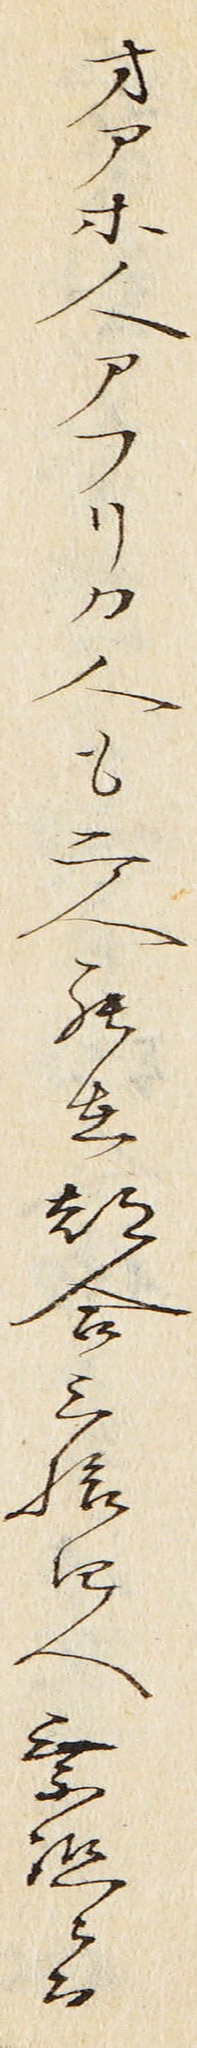オアホ人アフリカ人も二人罷在都合三拾四人乗組に而
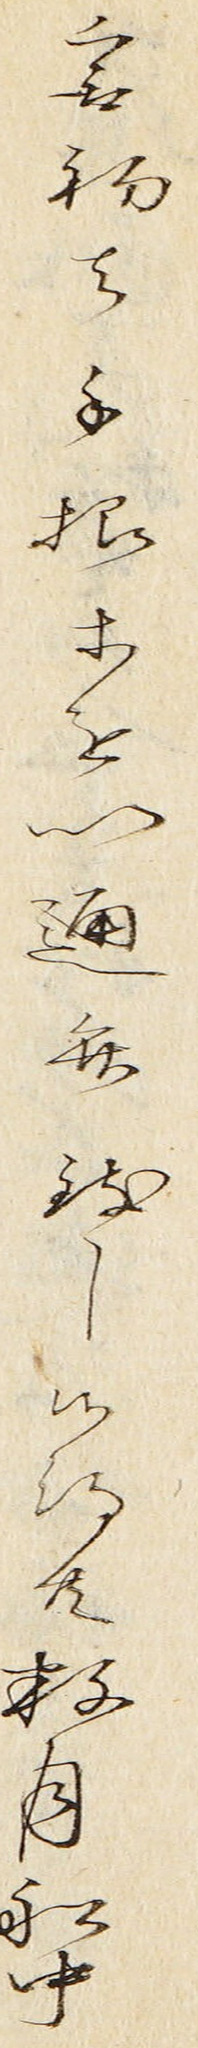最初は手振等を以通弁致し候得共数月船中
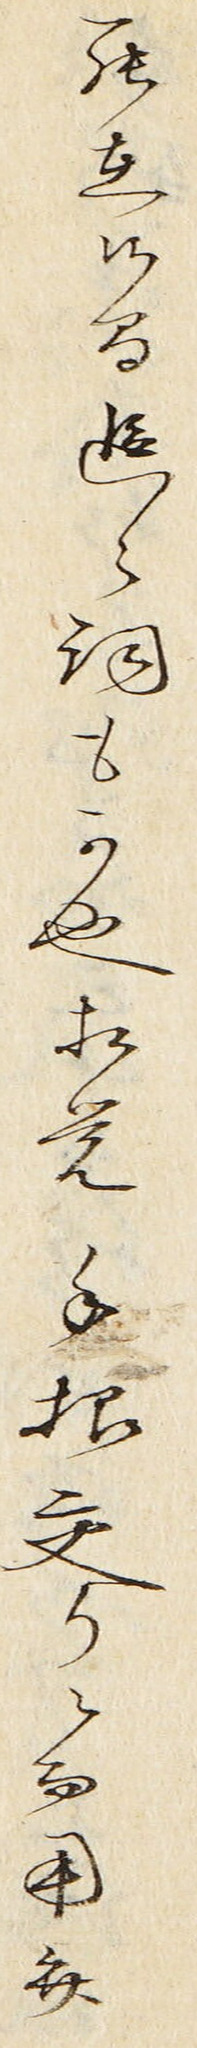罷在候間追々詞も可也相覚手振交りに而用弁
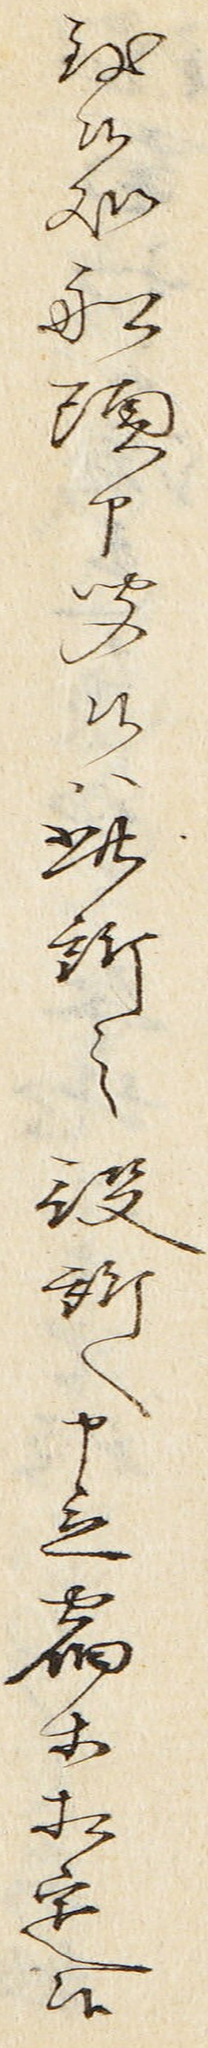致候処船頭申聞候は此所之役所へ申立宿等相定候
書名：土佐中浜万次郎漂流記
